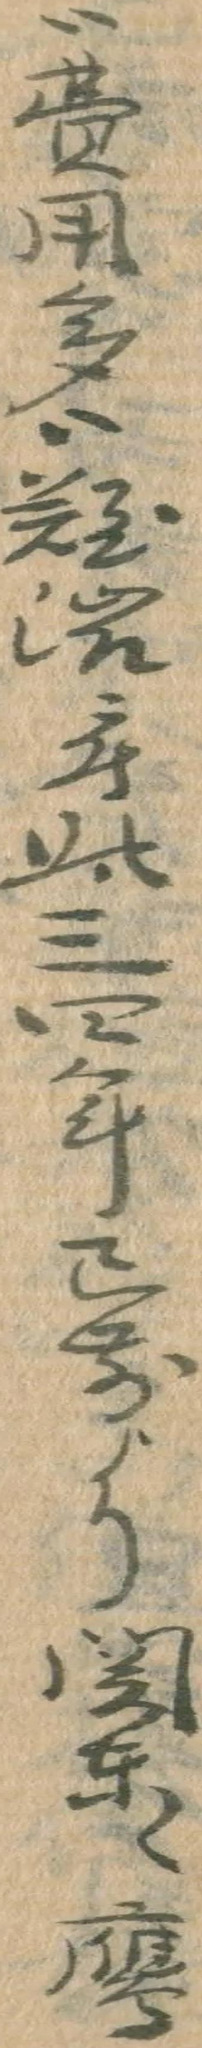御費用多御難渋ニ付、此三四年已前より関東へ鷹
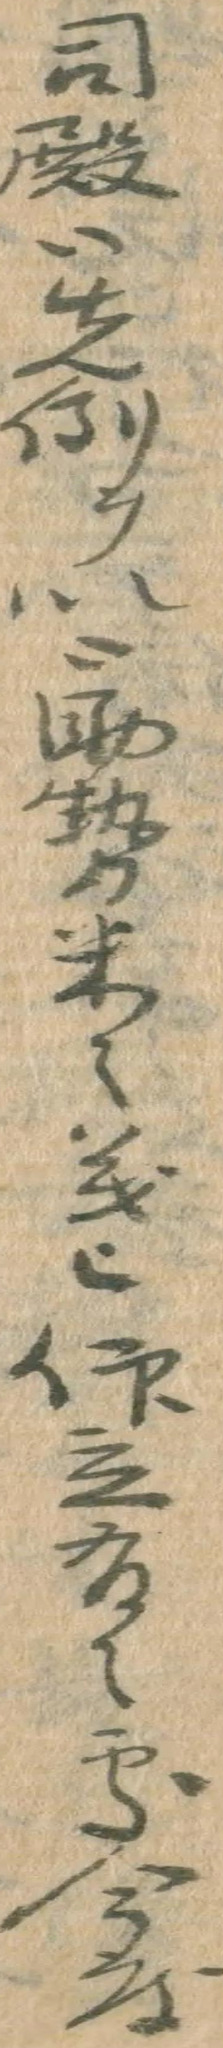司殿御先例を以御助勢米之義被仰立有之處、今度
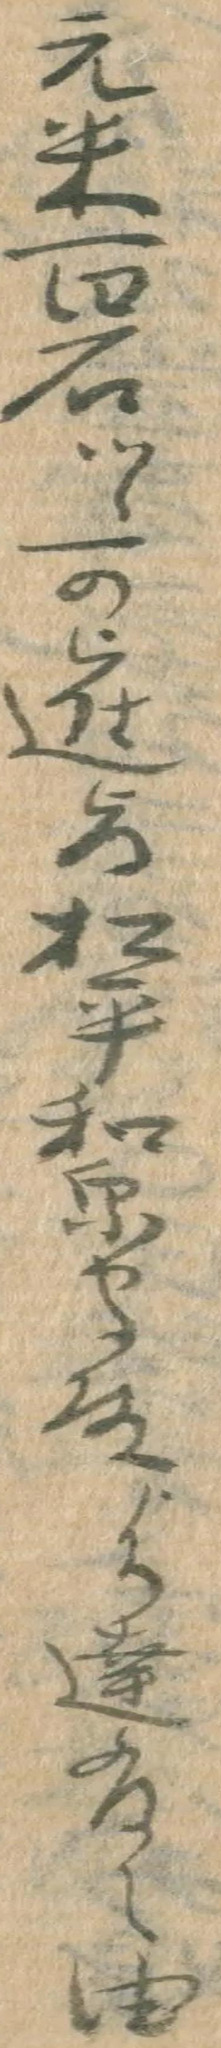元米百石ツヽ可被進旨松平和泉守殿より達有之由、
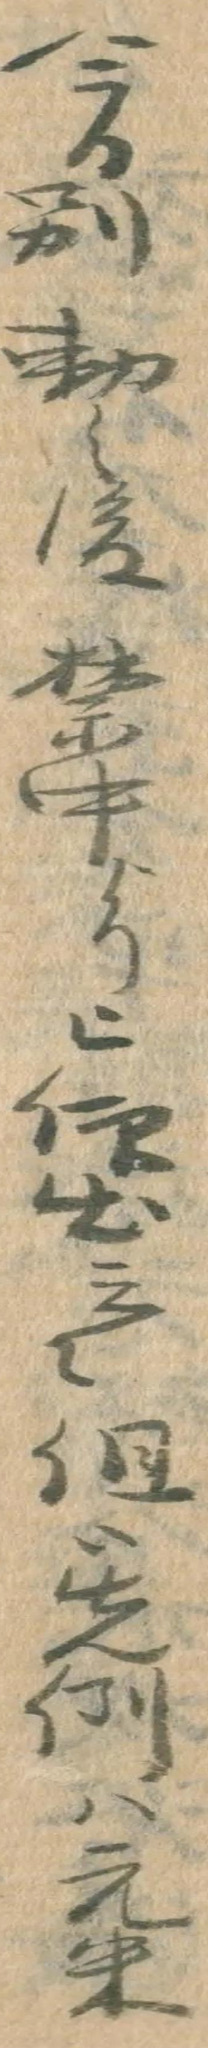今日別勅之後、禁中より被仰出云〻、但御先例ハ元来

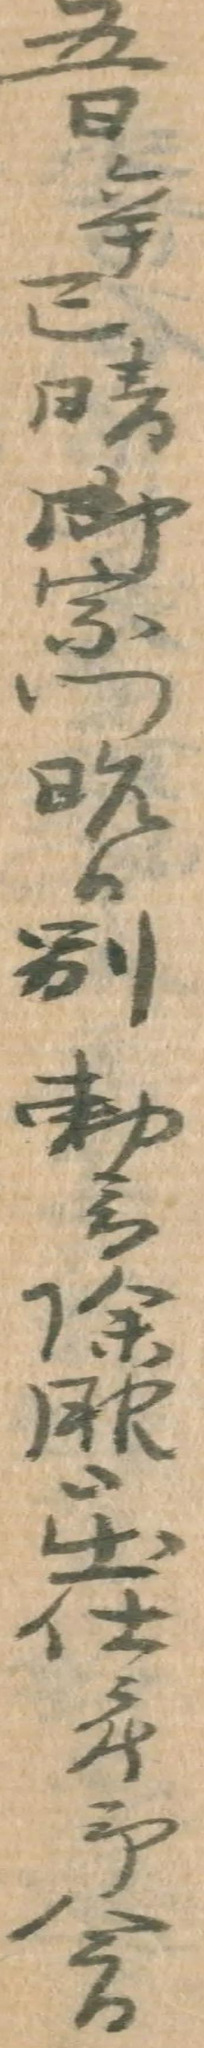五日辛巳晴御家門昨日別勅ニ而除服御出仕ニ付今日
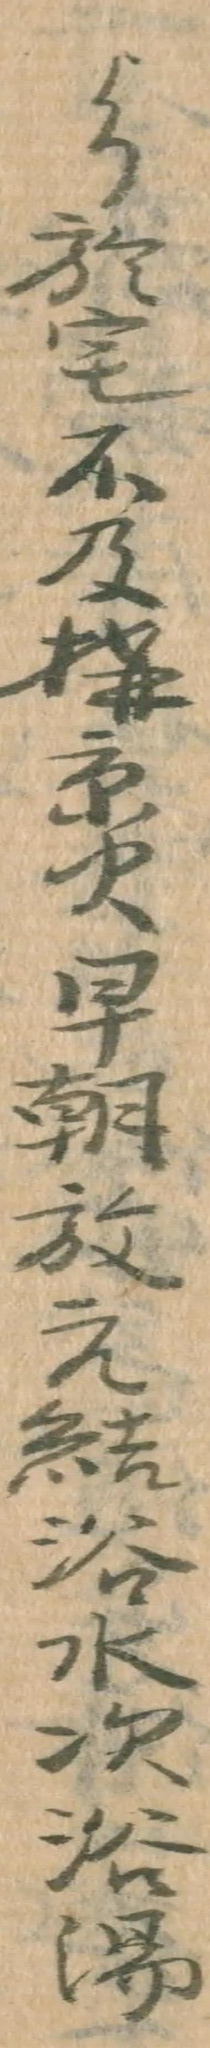より於宅不及構京火早朝放元結浴水次浴湯
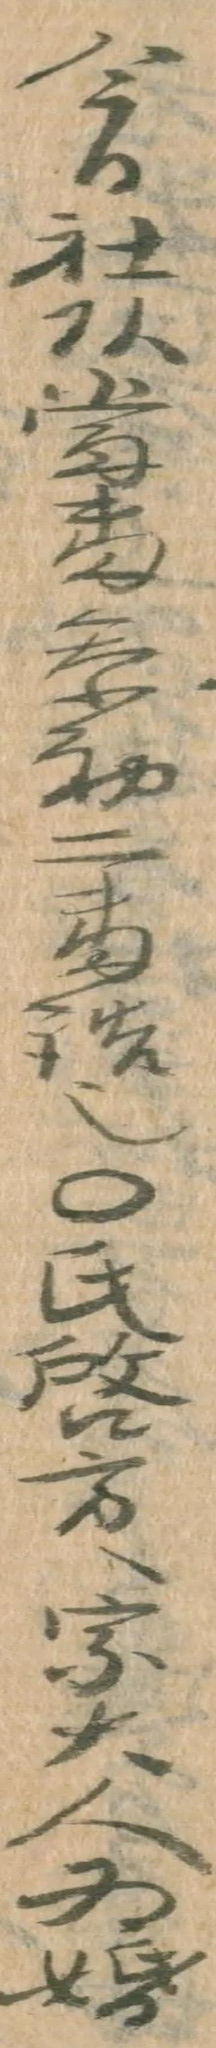今日社頭当番参勤二番詰也○氏啓方へ家大人為婚
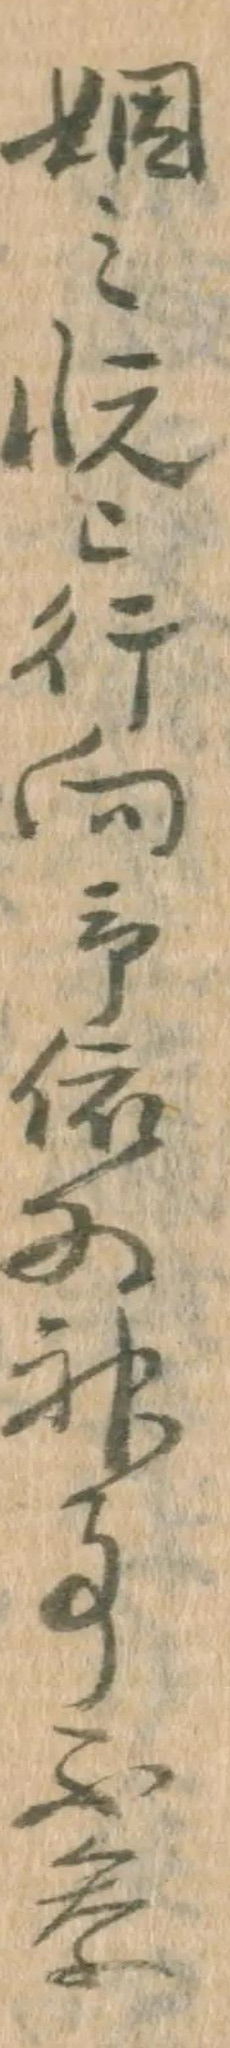姻之悦被行向予依為神事不参
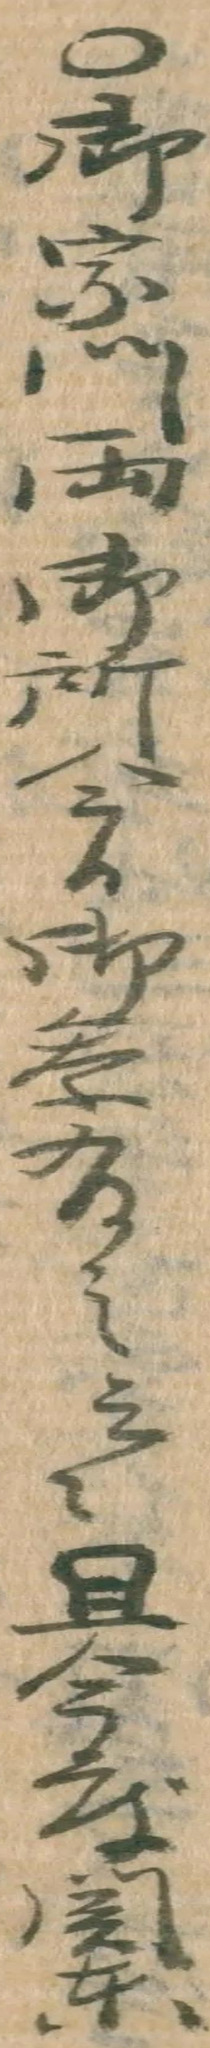○御家門両御所今日御祭有之云々且今度関東
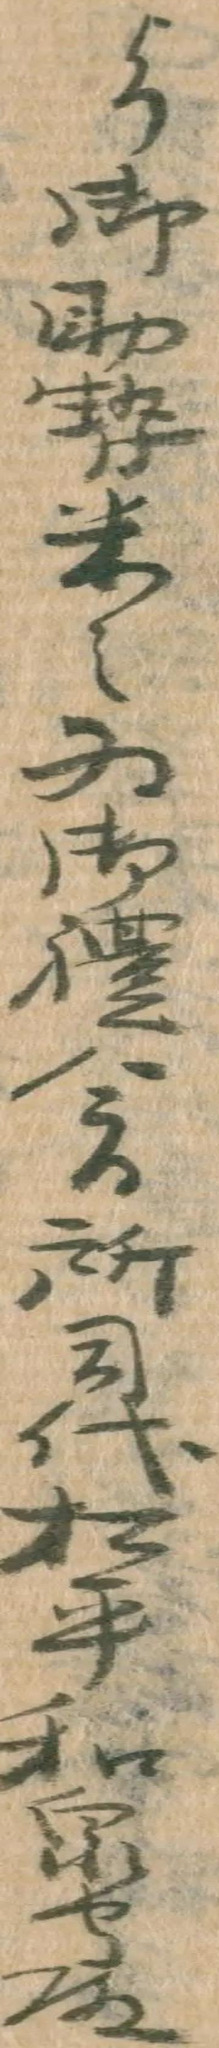より御助勢米之為御禮今日所司代松平和泉守殿
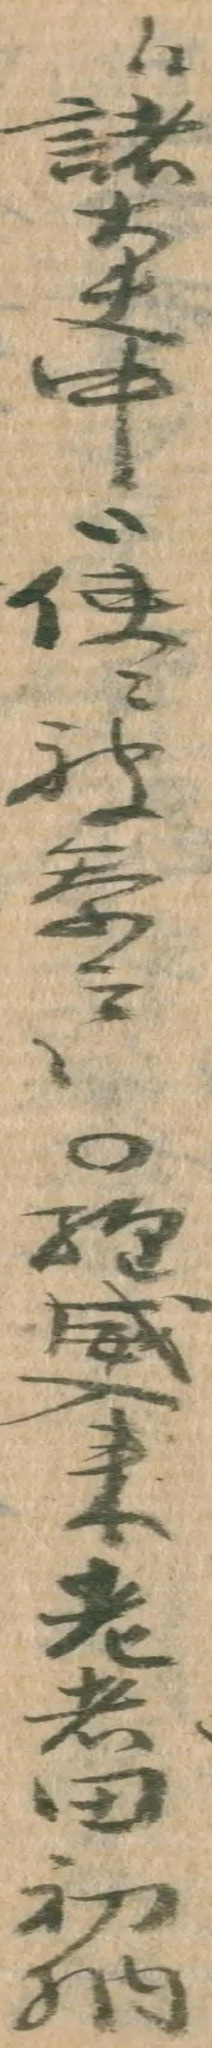え諸大夫中御使ニ被参云々○経威入来老者田初納
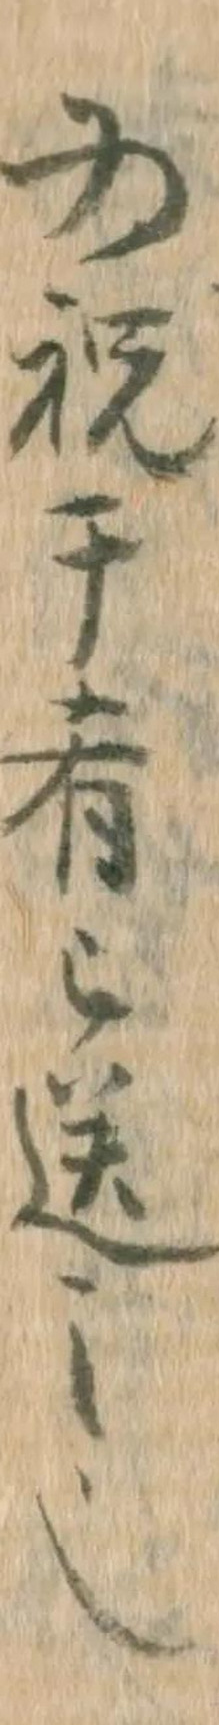為祝于肴被送之也
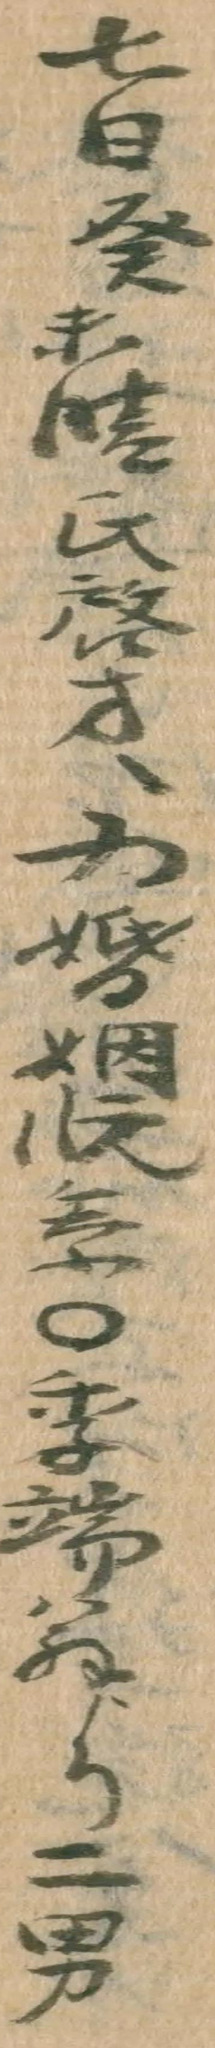七日癸未晴氏啓方ヘ為婚姻祝参〇季端翁より二男
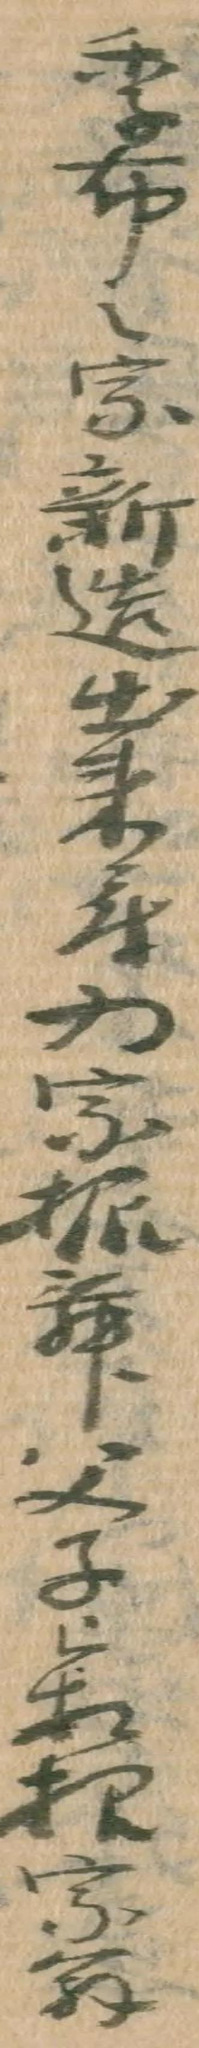季布之家新造出来ニ付為家振舞父子被相招家翁
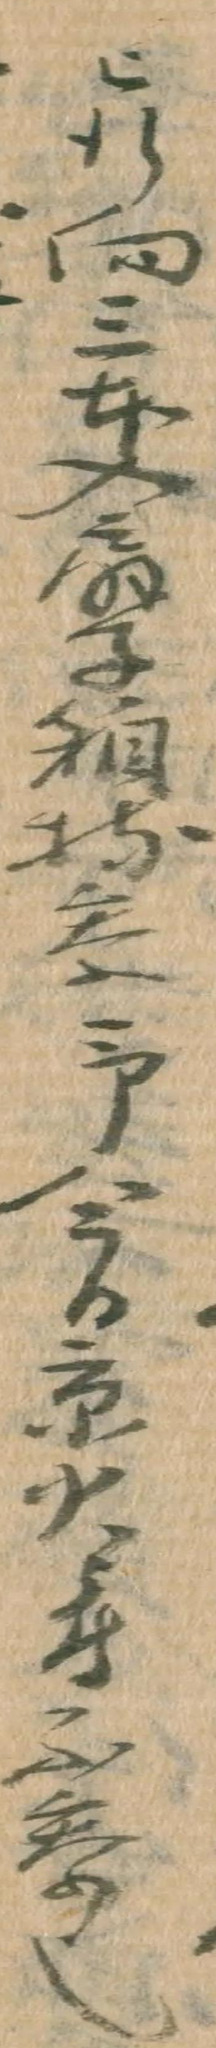被行向三本入扇子箱持参予今日京火ニ付不参也
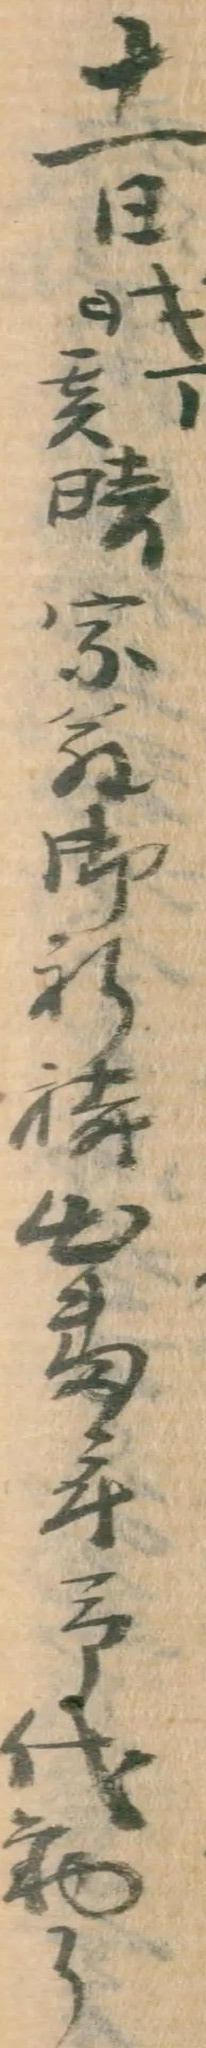十一日丁亥晴家翁御祈祷出番ニ付予代勤了
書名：賀茂社記録. 第63冊
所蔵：国立国会図書館 National Diet Library, JAPAN
